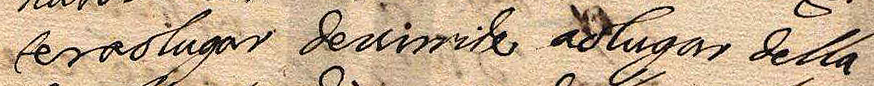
ter ao lugar de uirride ao lugar della
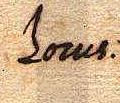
Locus.
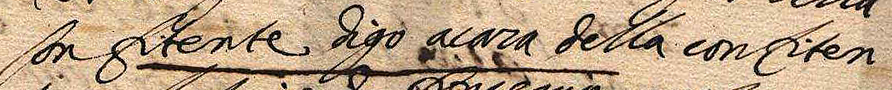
Confitente digo a caza della confiten
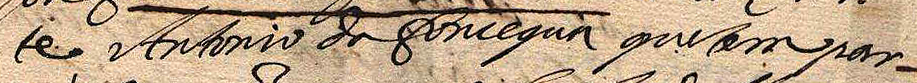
te Antonio da foncequa que tem par
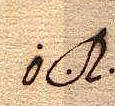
o R.
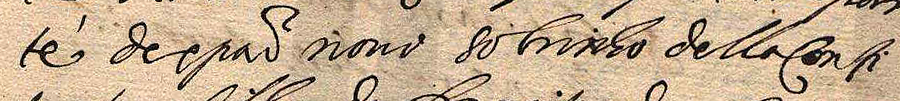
te de xpaõ nouo sobrinho della Confi
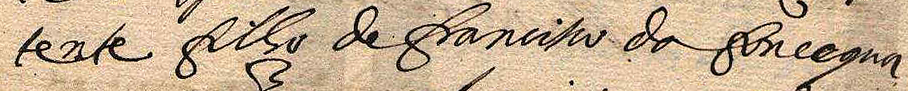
tente filho de francisco da foncequa
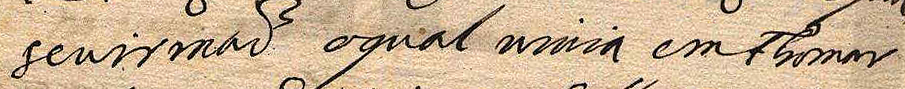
seu irmão o qual uiuia em thomar
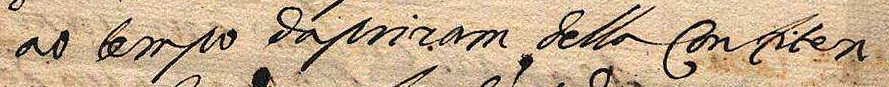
ao tempo da prizam della Confiten
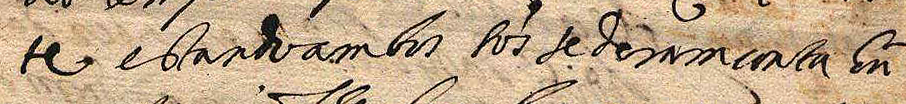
te estando ambos sós se deram conta hū
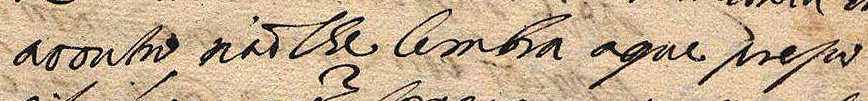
ao outro naõ lhe lembra a que prepo
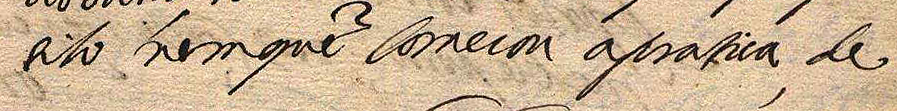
sito nem quē começou a pratica de
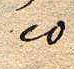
co
